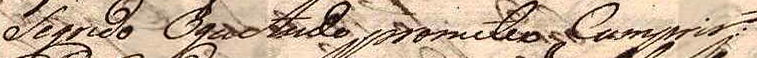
segredo O que tudo prometeo Cumprir.
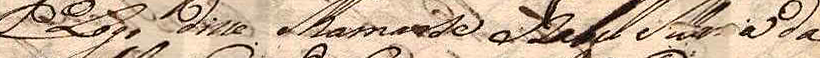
E Logo disse chamarse IZabel _____a da
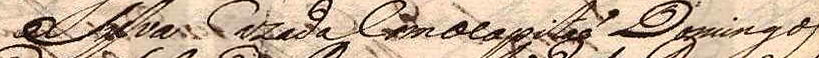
Sylva Cazada Com o capitaõ Domingos
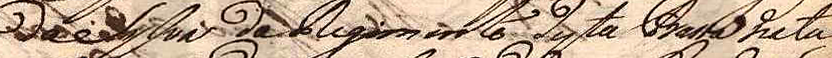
da Sylva do Regimento desta Prassa natu
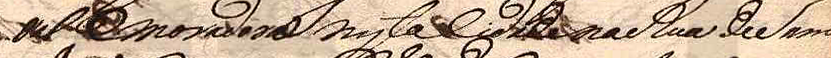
ral e moradora nesta cidade na Rua de Sam
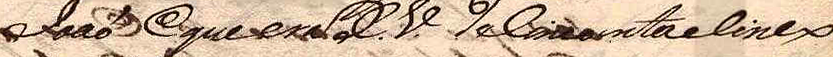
Ioaõ e que era X. V. de Cuarenta cinco
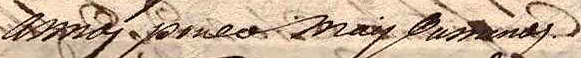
annos pouco mais ou menos.
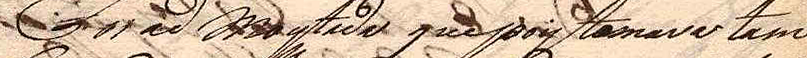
Foi admoestada que pois tomava tam
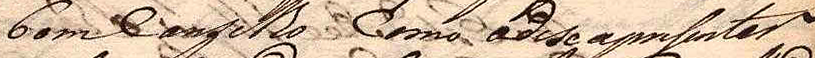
bem Conselho como o dise apresentar
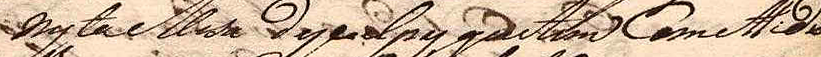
nesta Mesa desculpas que tem Comettido
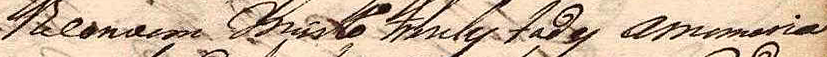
lhe convem muito trazelas todas a memoria
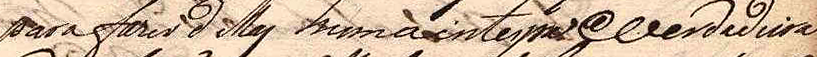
para fazer dellas huma inteyra e verdadeira
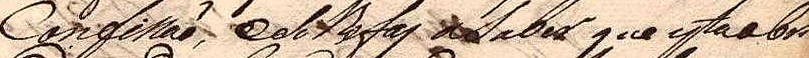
Confissaõ, e se lhe fas a Saber que esta obri
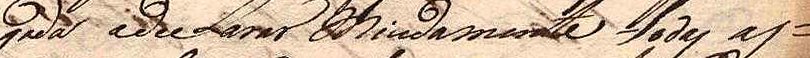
gada a decLarar miudamente todas as
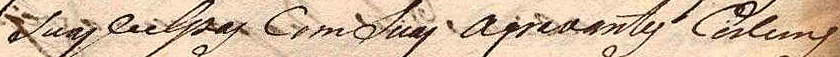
suas culpas Com Suas agravantes Circuns
